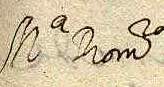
Ma Romra
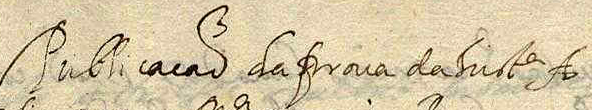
Publicacaõ da proua da Iusta A
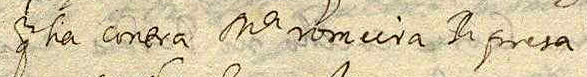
q̄ ha contra Ma romeira Re presa
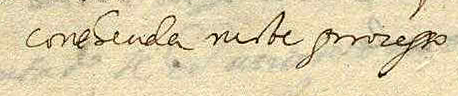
contheuda neste processo
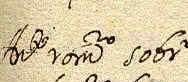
Anto romro sobro
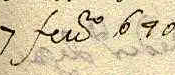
7 feuro 640
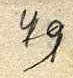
49
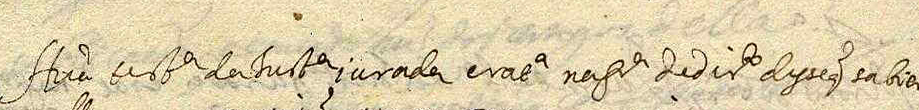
Huā testa da Iusta iurada e rata na fra de dirto disse q̄ sabia
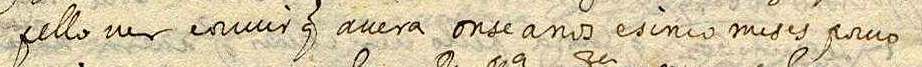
pello uer e ouuir q̄ auera onse anos e sinco meses pouco
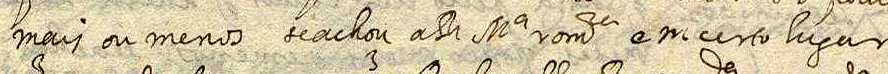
mais ou menos se achou a Re Ma romra em certo lugar
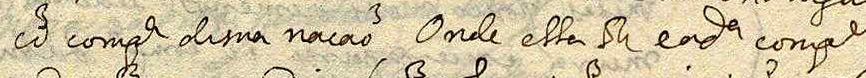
cō compa de sua naçaõ, Onde ella Re e a da compa
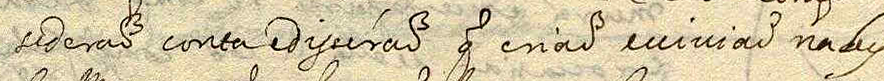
se deraõ conta e disseraõ q̄ criaõ e uiuiaõ na Ley
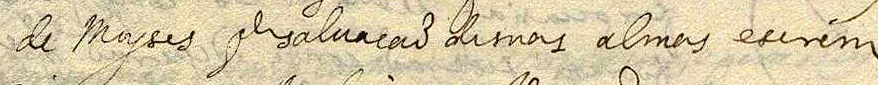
de Moyses pa saluaçaõ de suas almas e serem
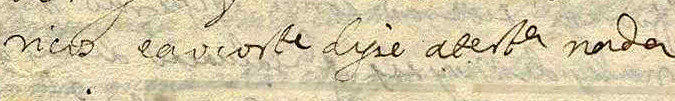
ricos e ao coste disse a testa nada.
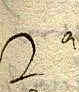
2a
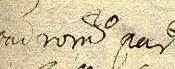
aõ rom.ro par.te
